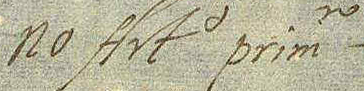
No Arto primro
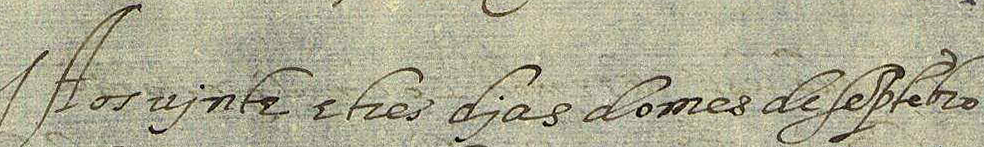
Aos ujnte E tres djas do mes de septēbro
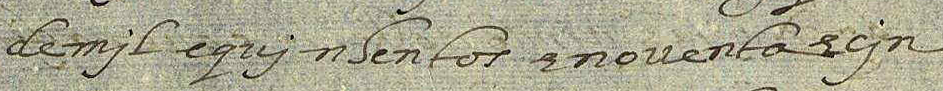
de mjl e qujnhentos E nouenta e cjn
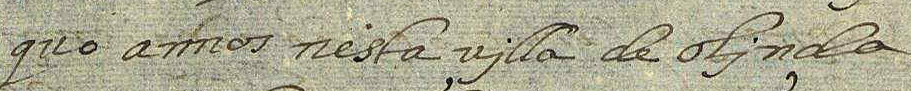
quo annos nesta ujlla de oljnda
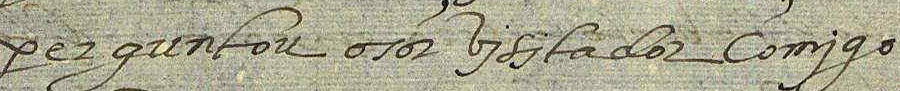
perguntou o sor̄ vjsjtador Cōmjgo
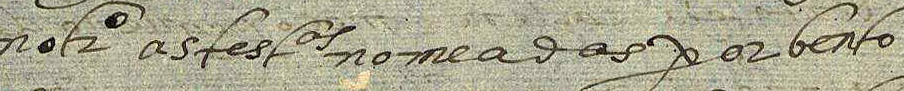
notro as testas nomeadas por bento
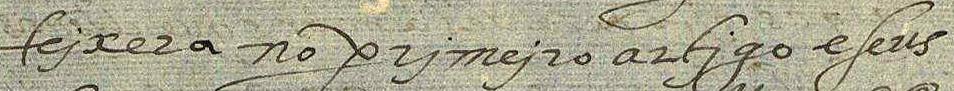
tejxera no prjmejro artjgo e seus
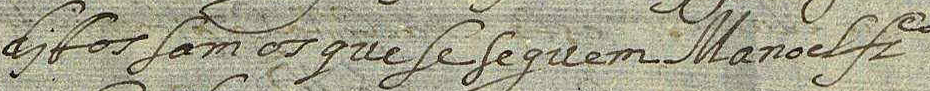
djttos sam os que se seguem Manoel frco
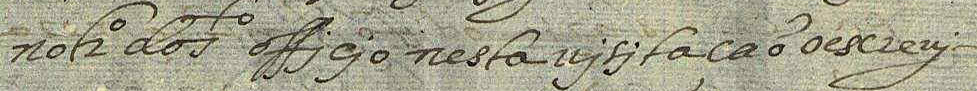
notro do sto offjcjo nesta ujsjtaçaõ o escreuj-
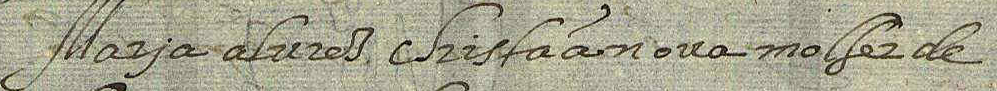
Marja alurez christaā noua molher de
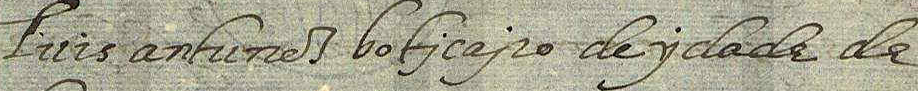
luis antunez botjcajro de ydade de
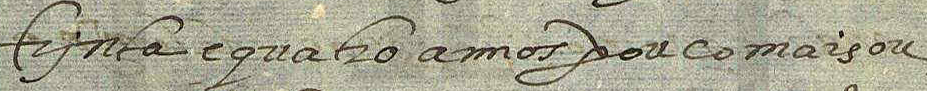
trjnta e quatro annos pouco mais ou
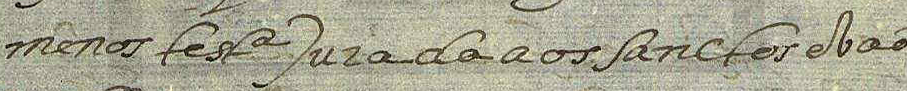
menos testa Jurada aos sanctos evaõ
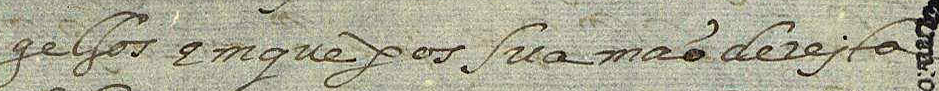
gelhos Em que pos sua maõ derejta
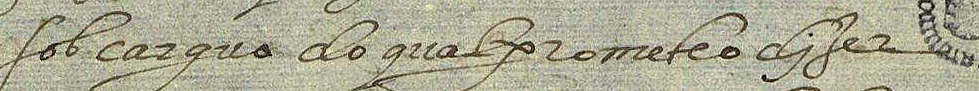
sob carguo do qual prometeo djzer
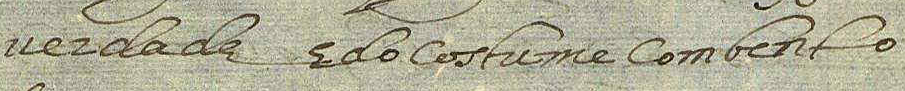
uerdade E do costume com bento
